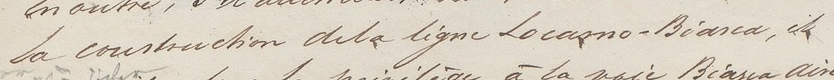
la construction de la ligne Locarno–Biasca, il
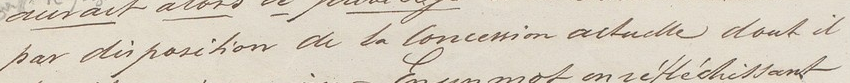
par disposition de la Concession actuelle dont il
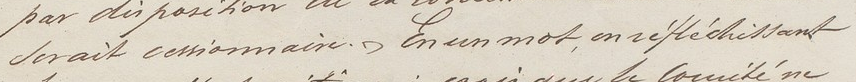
serait cessionnaire. – En un mot, en réfléchissant
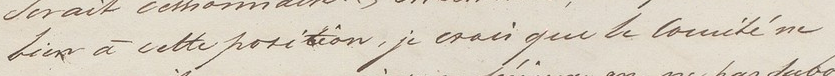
bien à cette position, je crois que le Comité ne
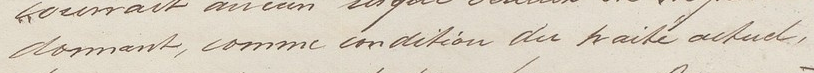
donnant, comme condition du traité actuel,
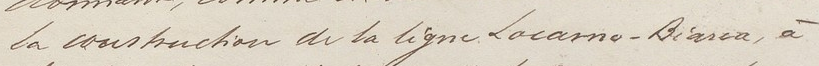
la construction de la ligne Locarno–Biasca, à
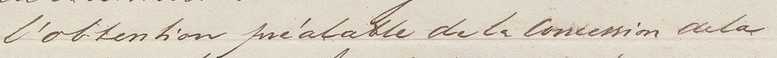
l'obtention préalable de la Concession dela
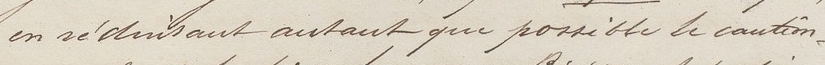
en réduisant autant que possible le caution-
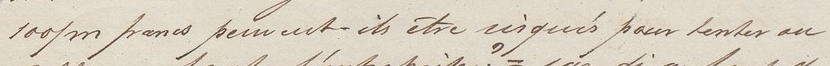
«100/m francs peuvent-ils être risqués pour tenter ou
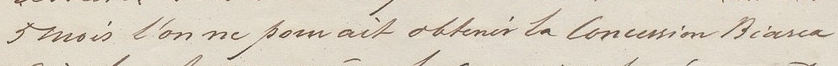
5 mois l'on ne pourait obtenir la Concession Biasca
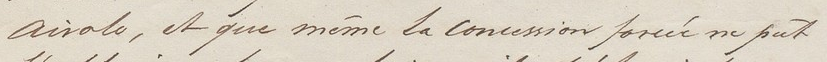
Airolo, et que même la Concession forcée ne pût
